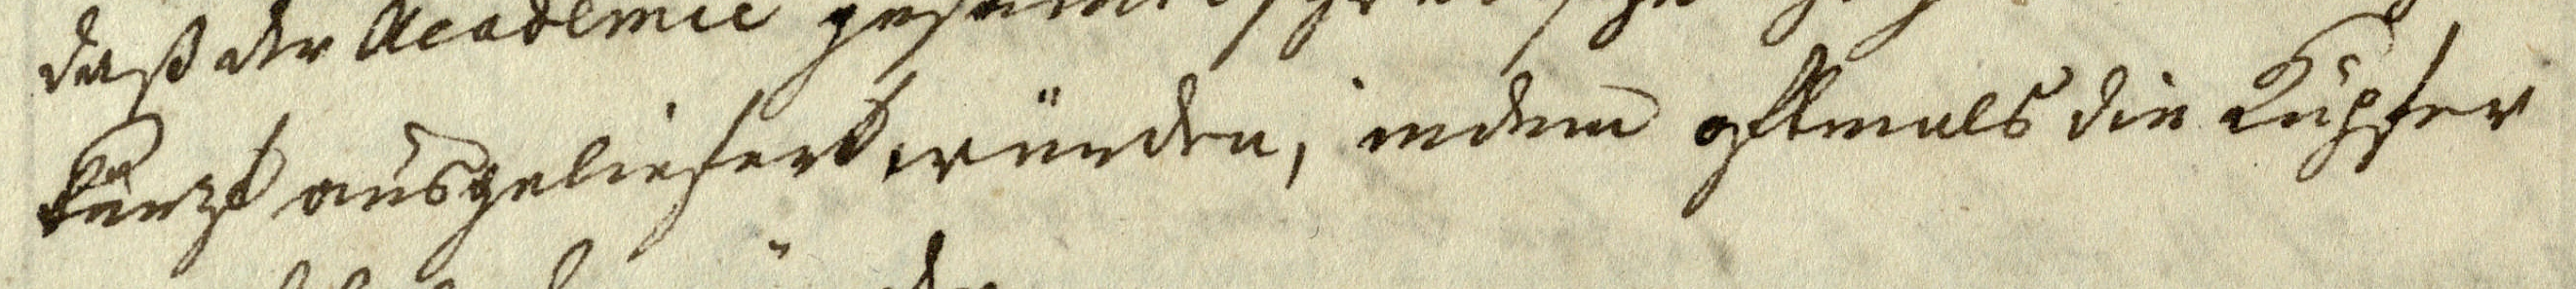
kürzt ausgeliefert würden, indem oftmals die Kupfer
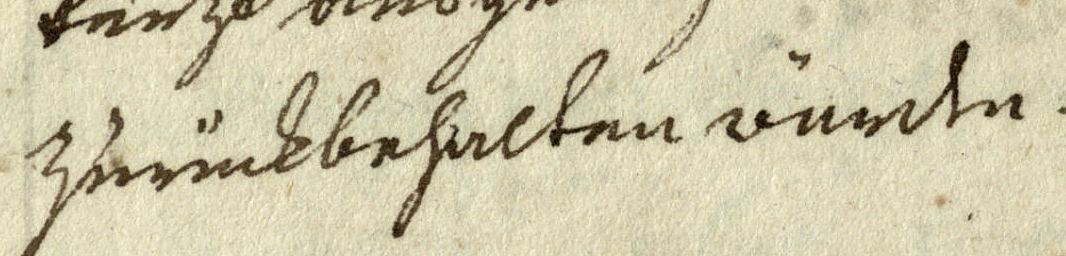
zurückbehalten würden.
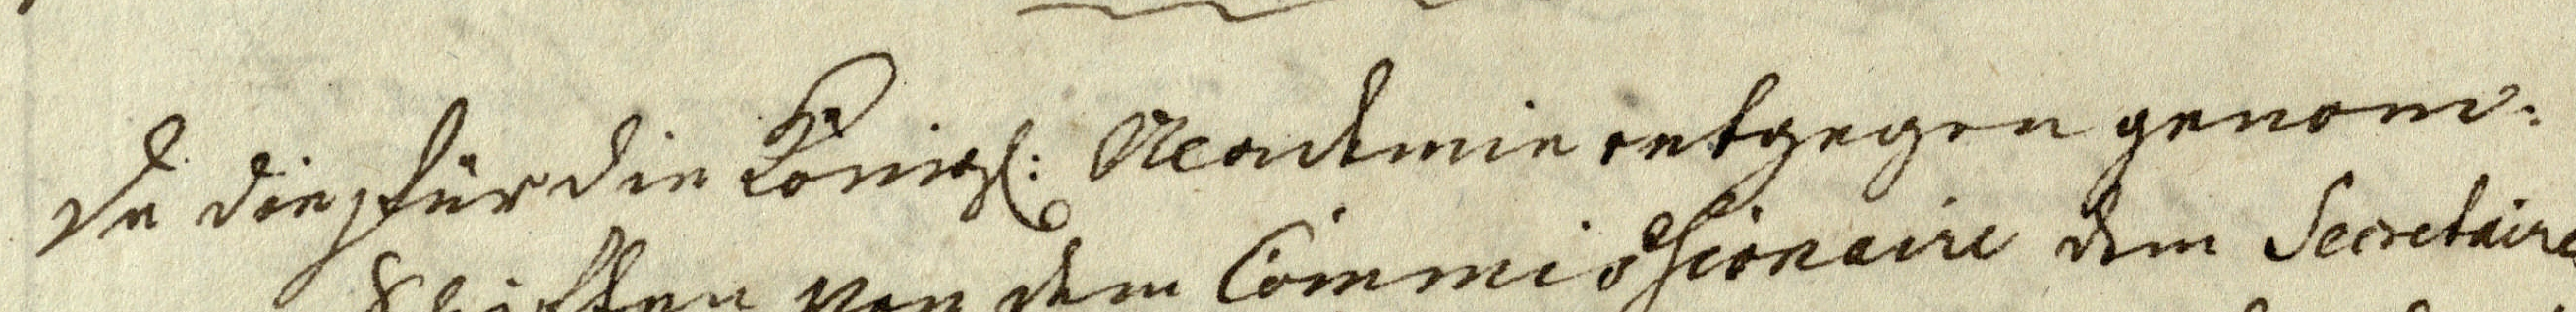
Da die für die Königl. Academie entgegen genom¬
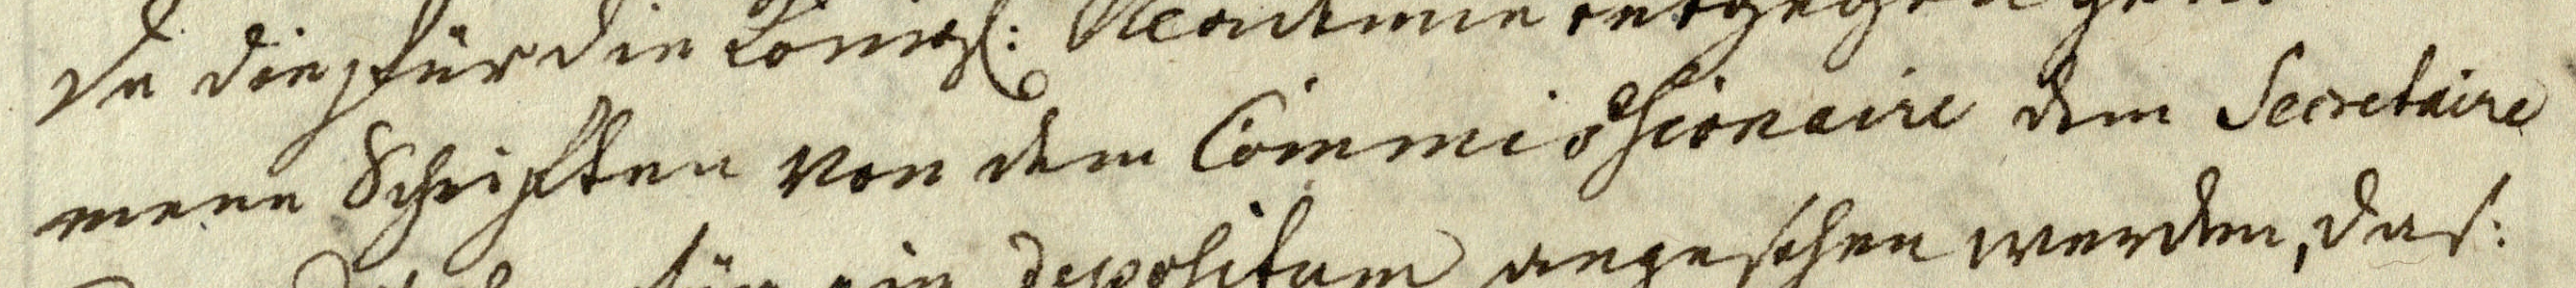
mene Schriften von dem Commissionaire dem Secretaire
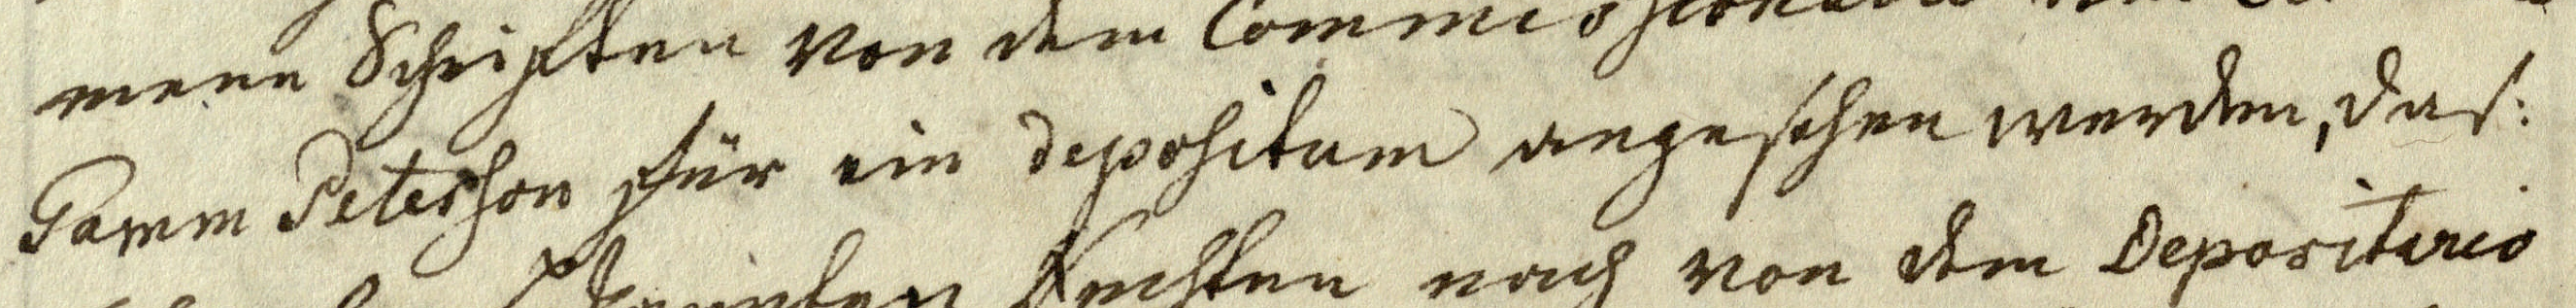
Gamm Peterson für ein depositum angesehen werden, das¬
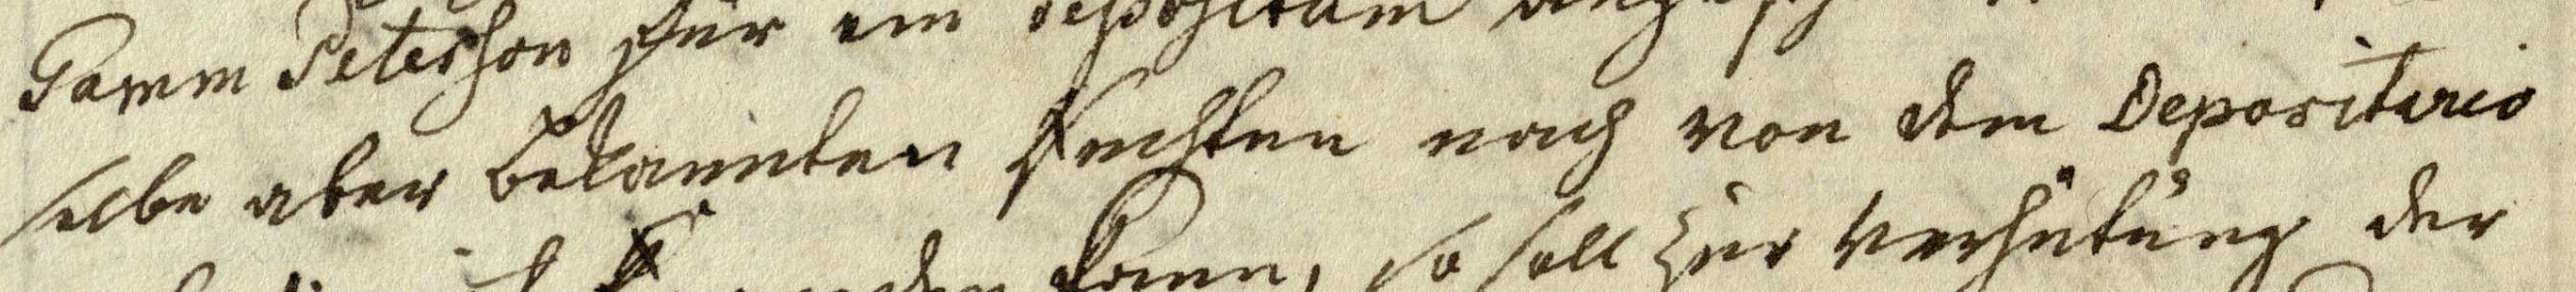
selbe aber bekannten Rechten nach von dem Depositorio
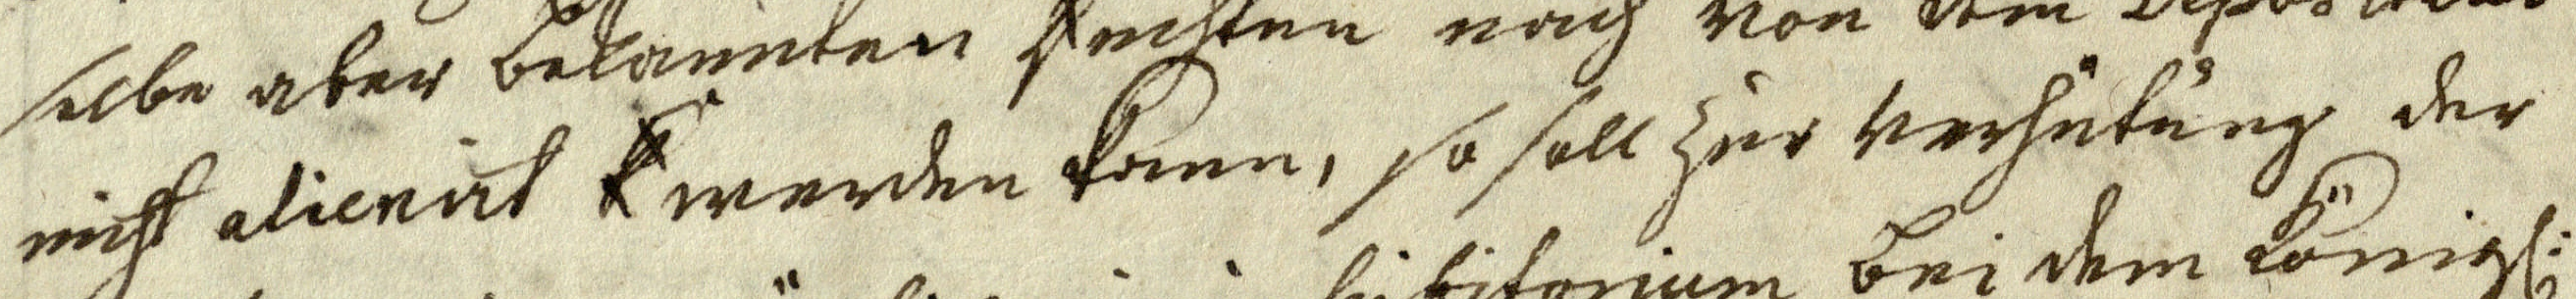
nicht alienirt werden kann, so soll zur Verhütung der
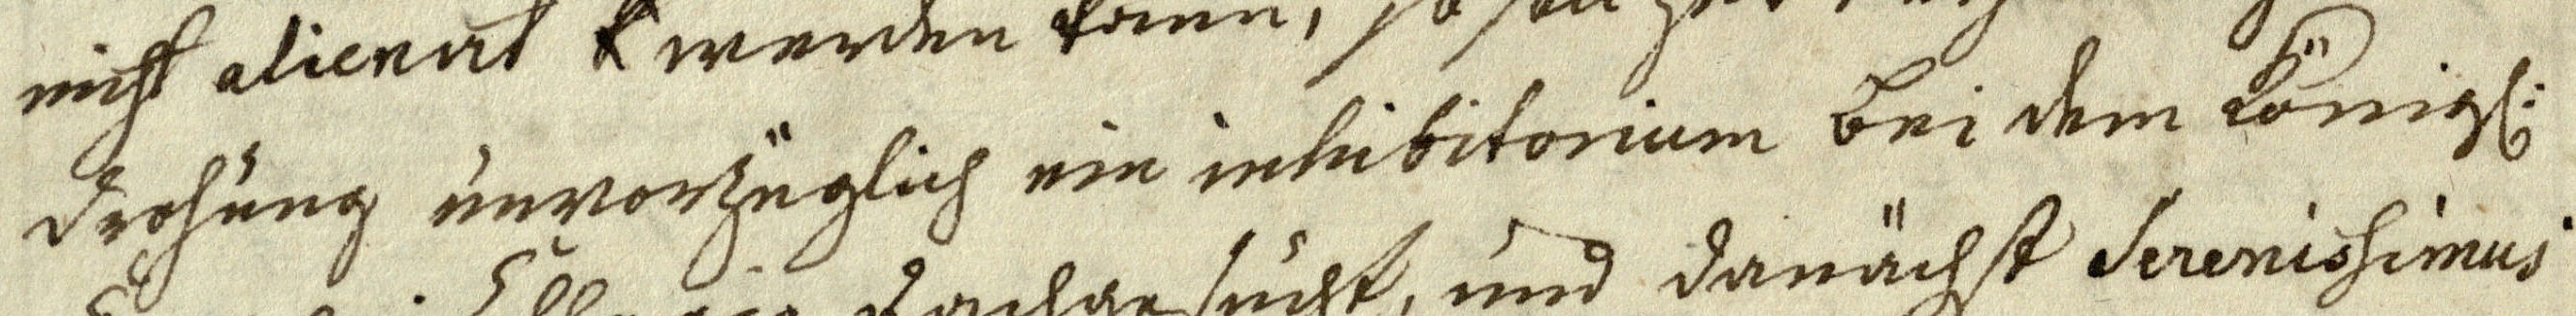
Drohug unverzüglich ein inhibitorium bei dem Königl.
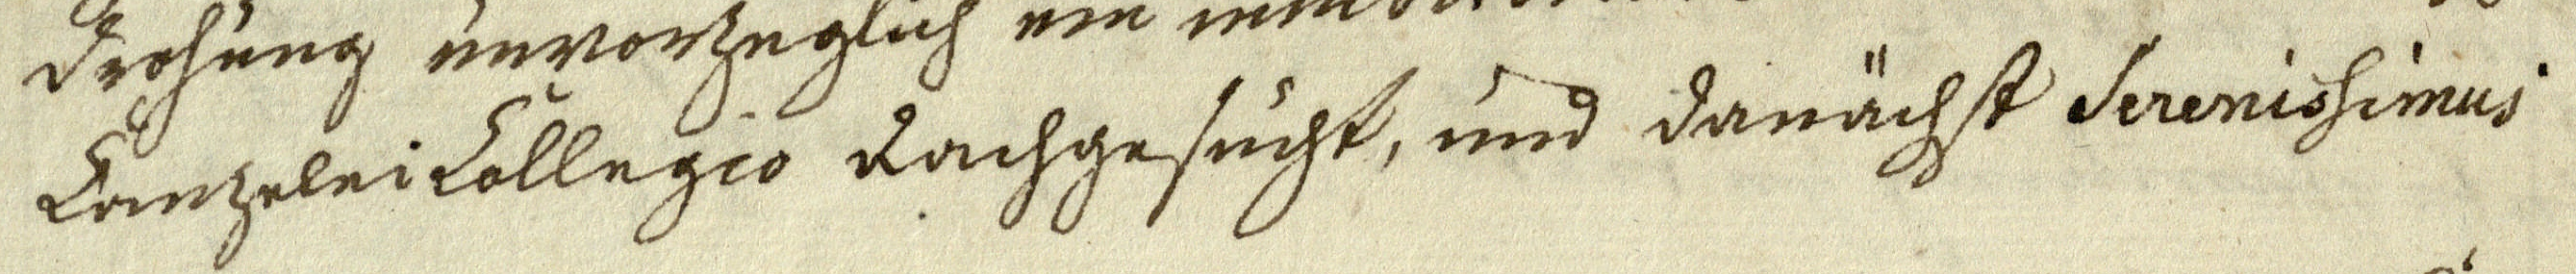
Canzelei Collegio nachgesucht, und danächst Serenissimus
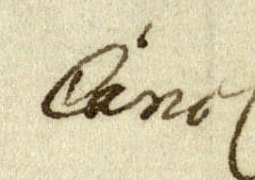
Canc.
